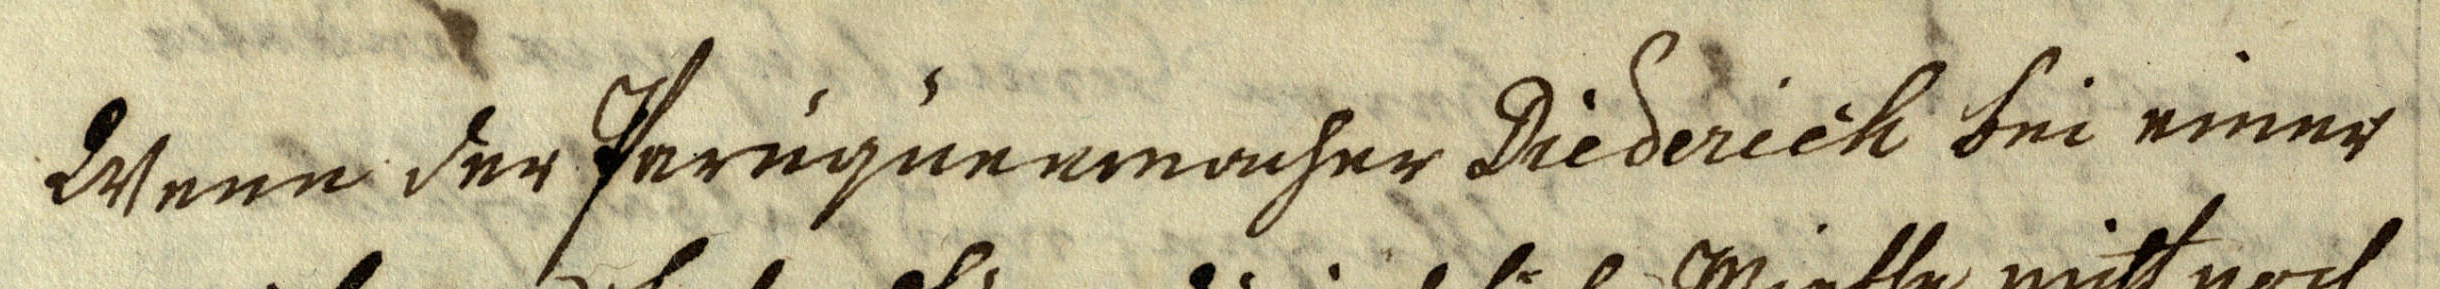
Wenn der Paruquenmacher Diederich bei einer
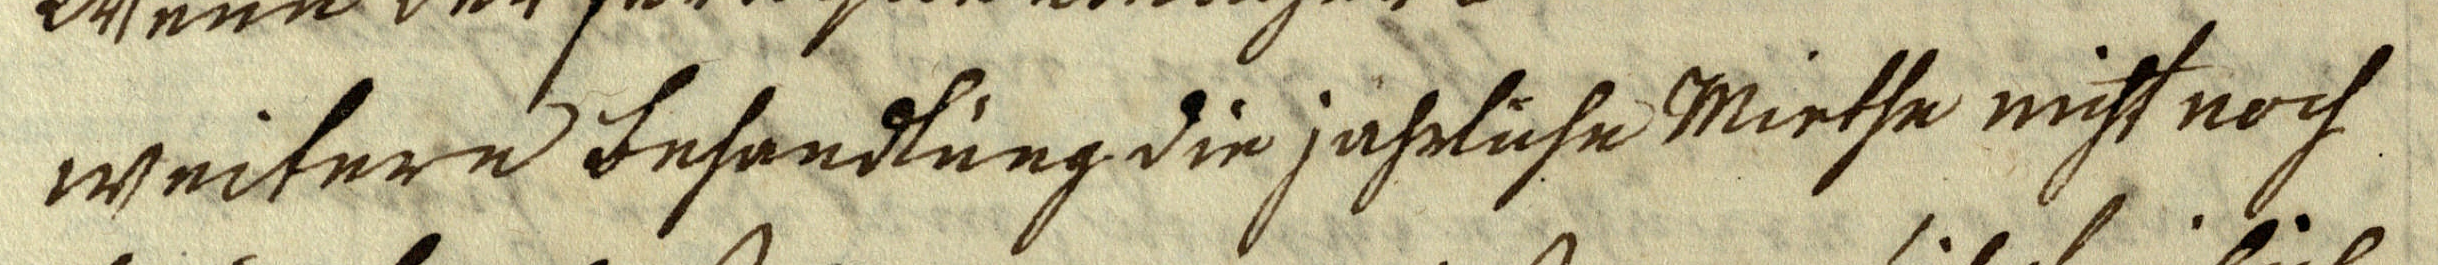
weiteren Behandlung die Miethe nicht noch
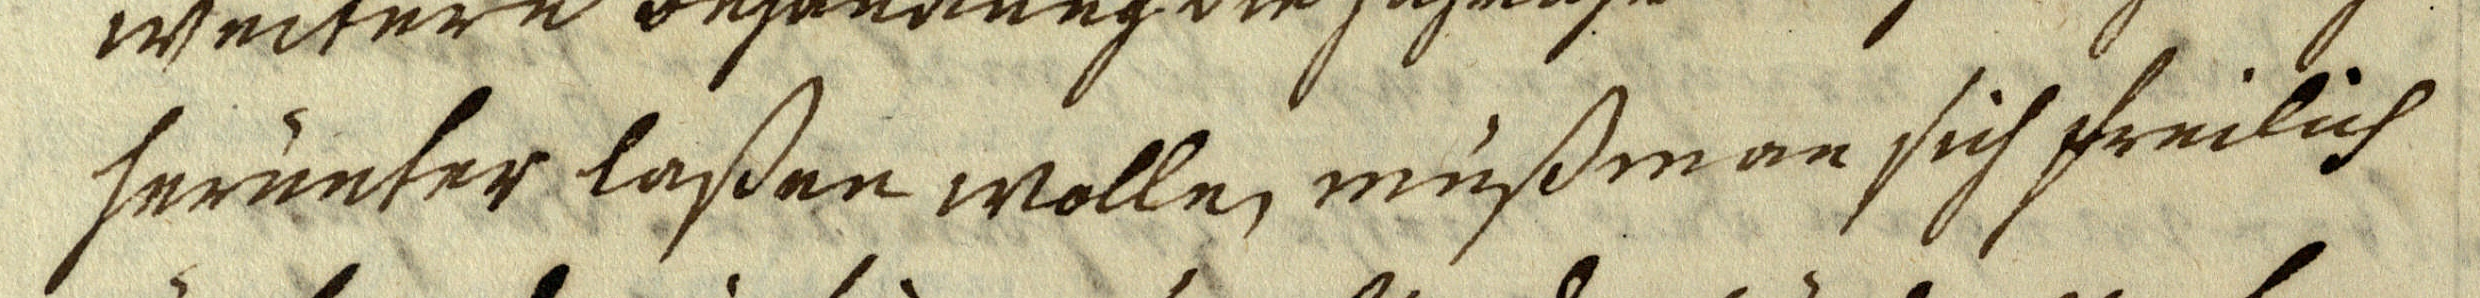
herunter lassen wolle, mußman an sich freilich
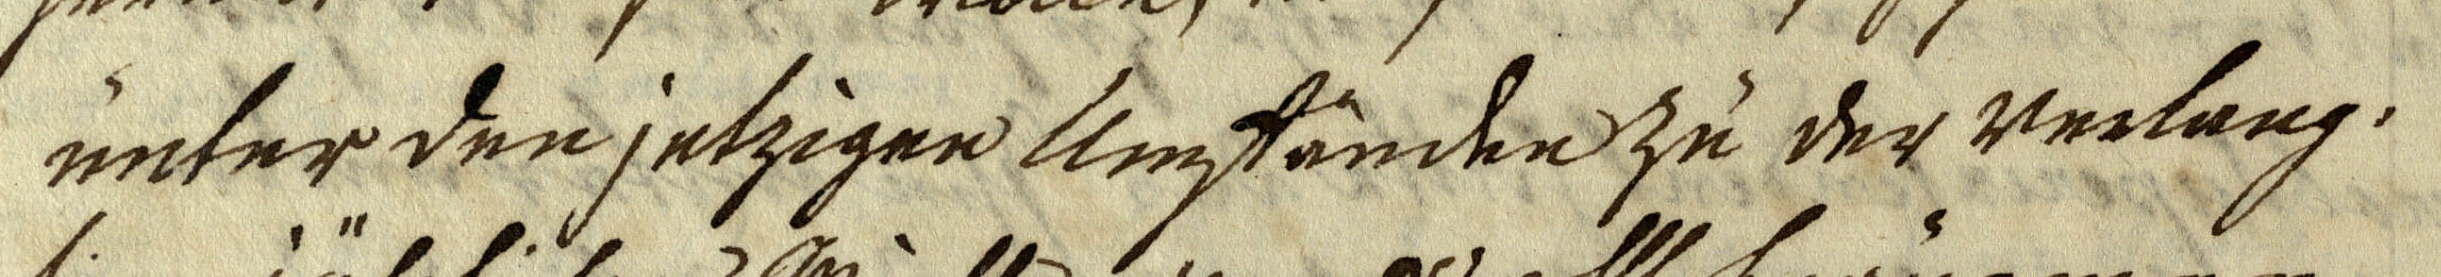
unter den jetzigen Umständen zu der verlang¬
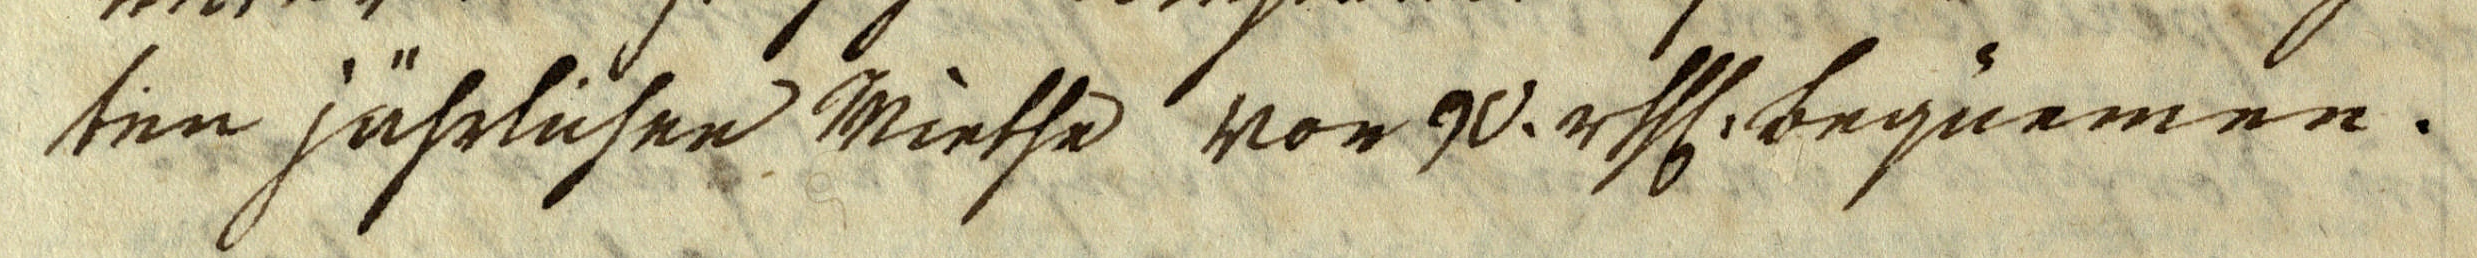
ten jährlichen Miethe von 90 rt. bequemen.
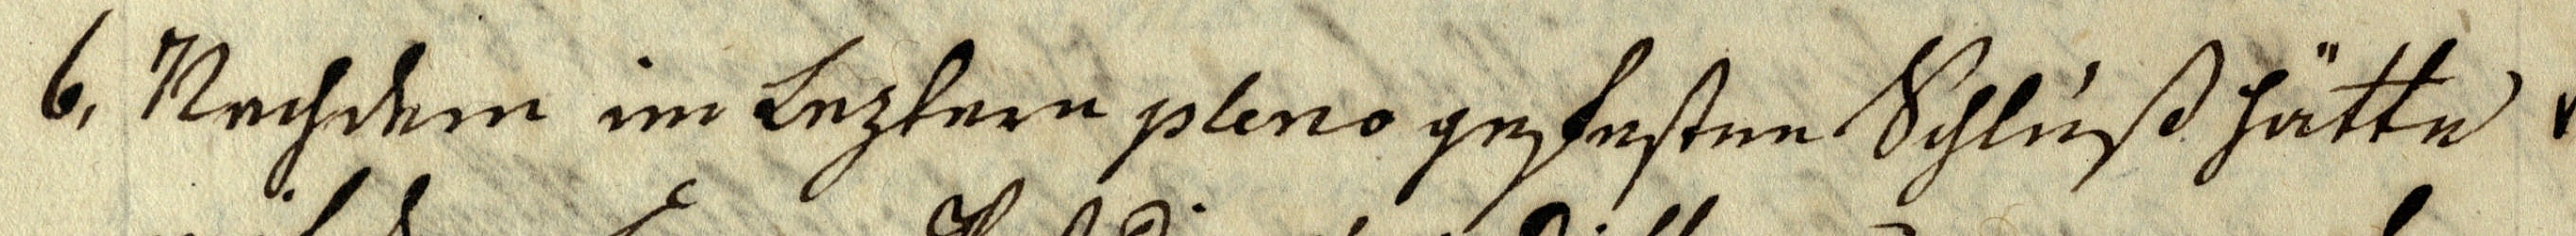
6. Nachdem im leztern pleno gefaßten Schluß hätte
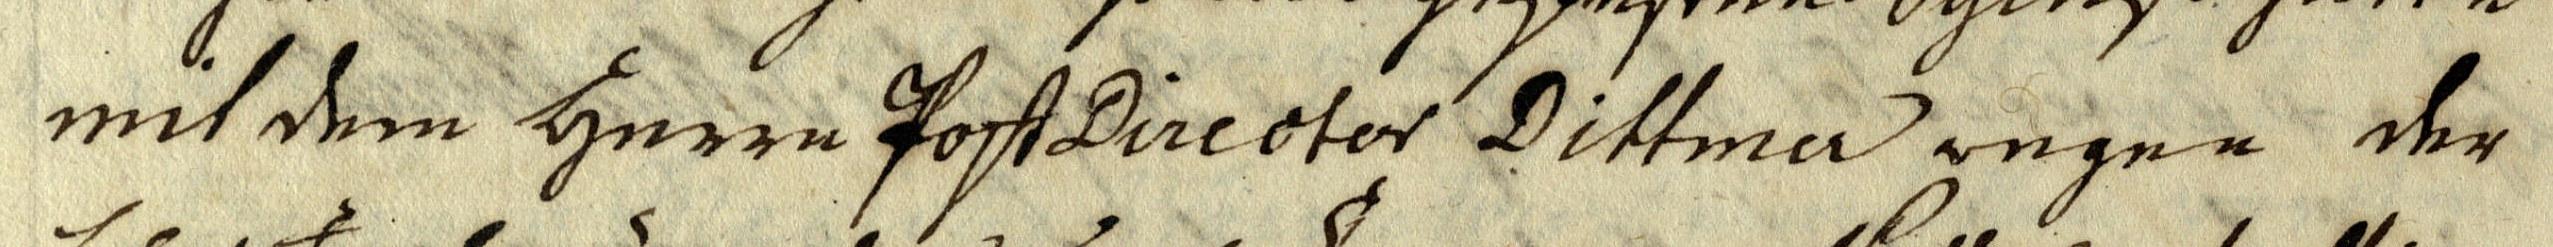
mit dem Herrn PostDirector Dittmer wegen der
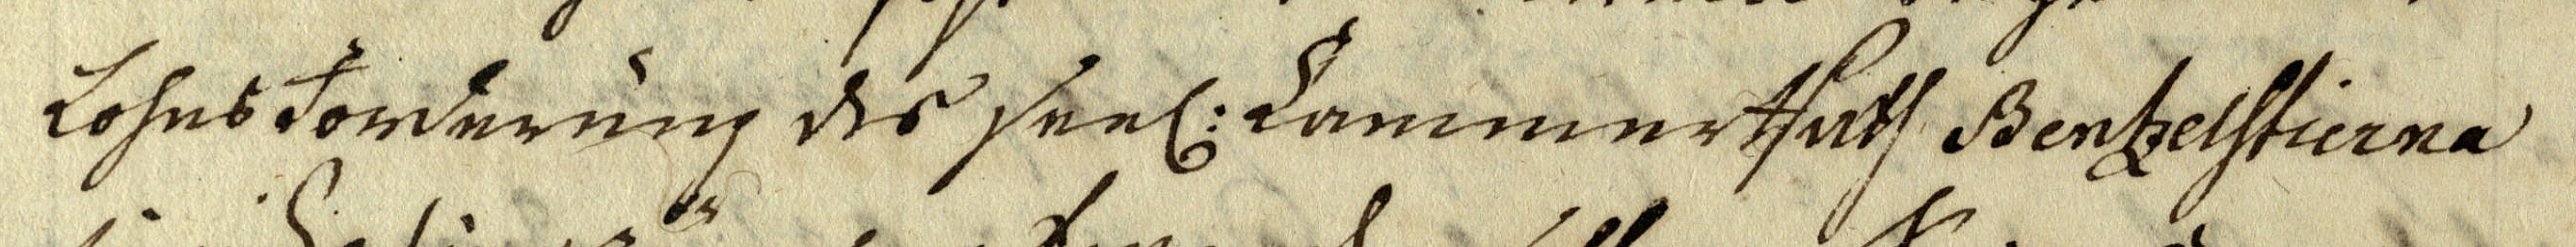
Lohns Forderung des seel. cammerrath Bentzelstierna
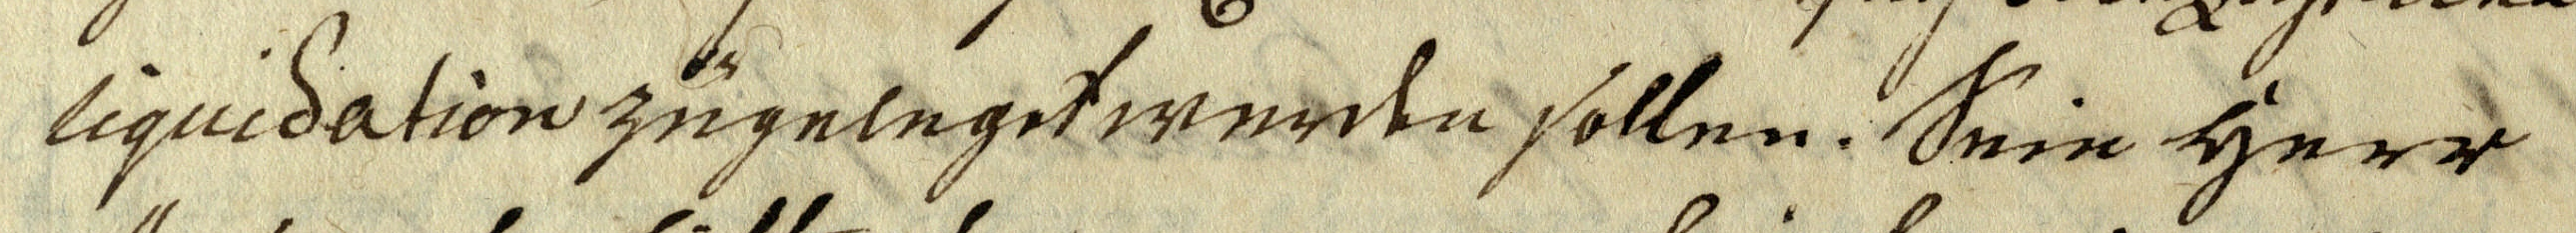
liquidation zugeleget werden sollen. Sein Herr
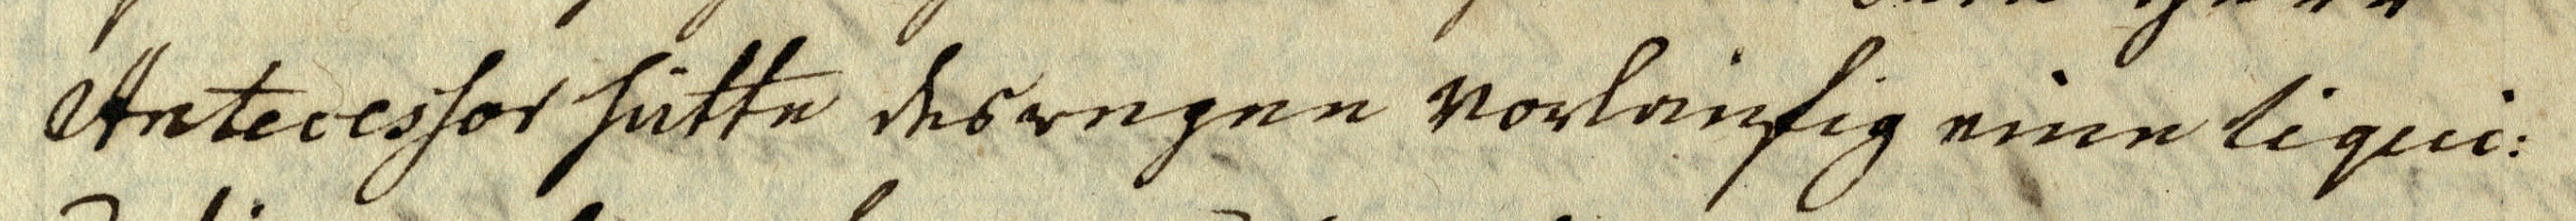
Antecessor hätte deswegen vorläufig eine liqui¬
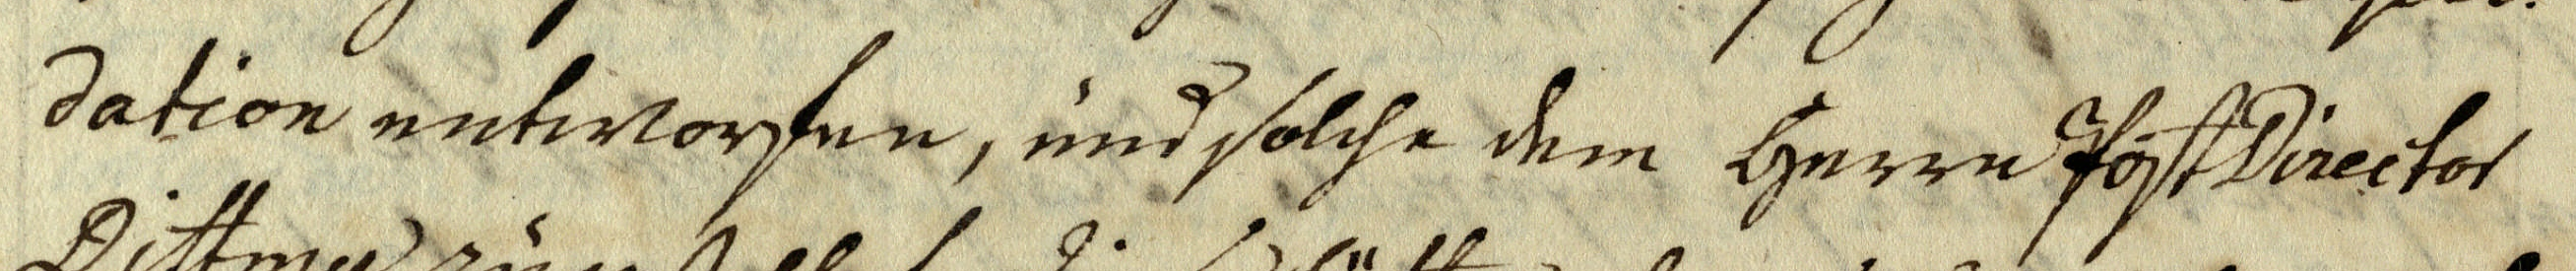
dation entworfen, und solche dem Herrn PostDirector
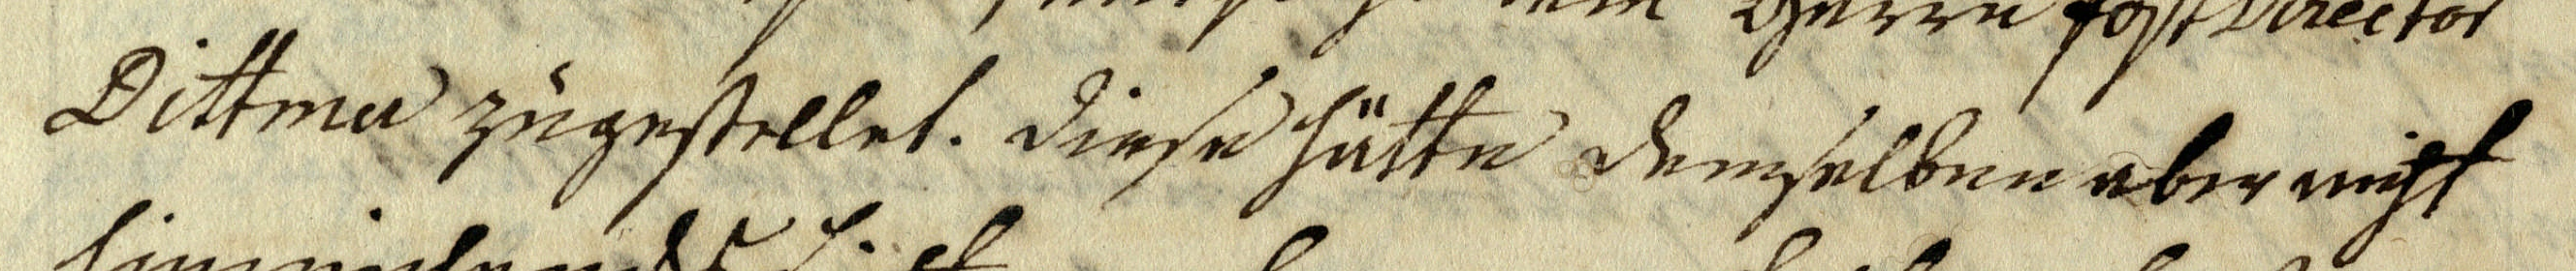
Dittmer zugestellet. Diese hätte demselben aber nicht
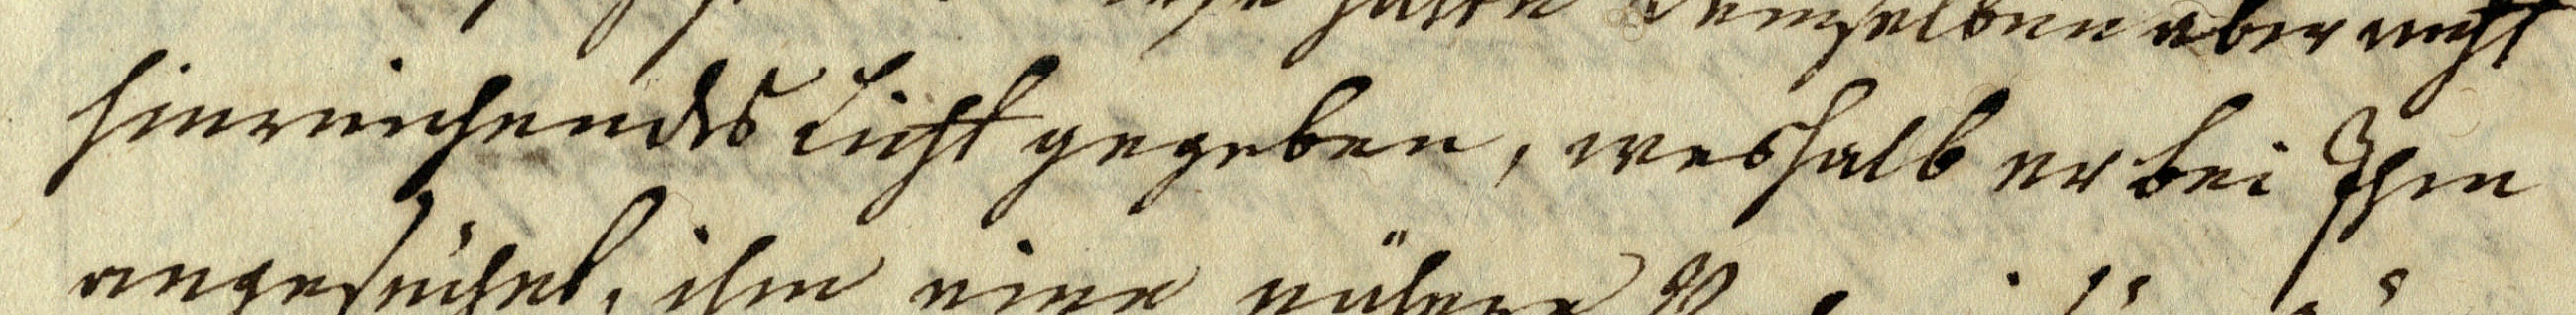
hinreichendes Licht gegeben, weshalb er bei Ihm
